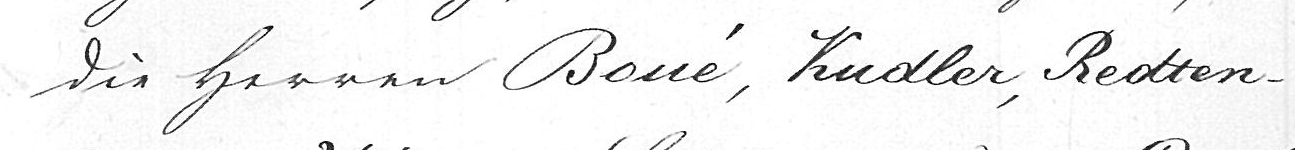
die Herren Boué, Kudler, Redten-
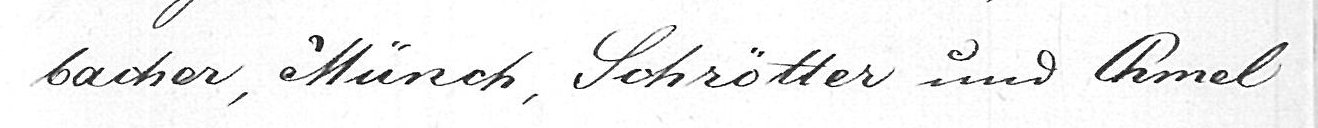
bacher, Münch, Schrötter und Chmel
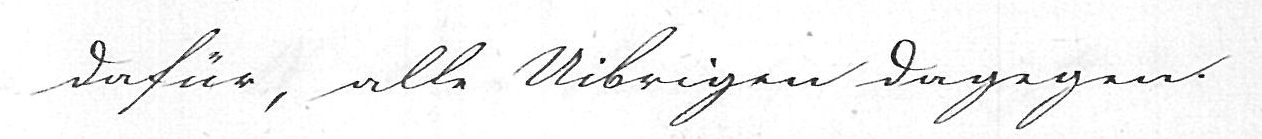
dafür, alle Uibrigen dagegen.
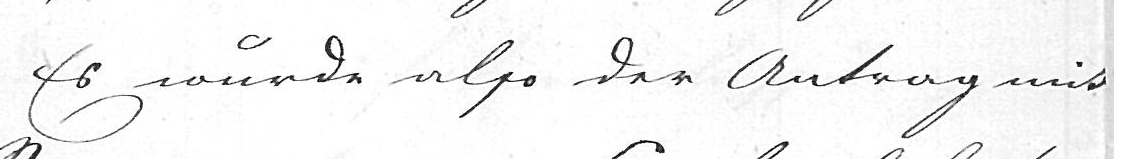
Es wurde also der Antrag mit
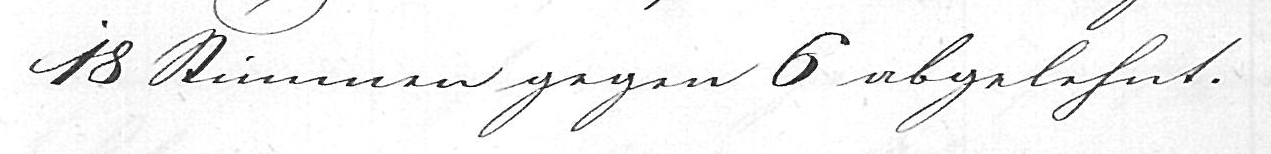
18 Stimmen gegen 6 abgelehnt.
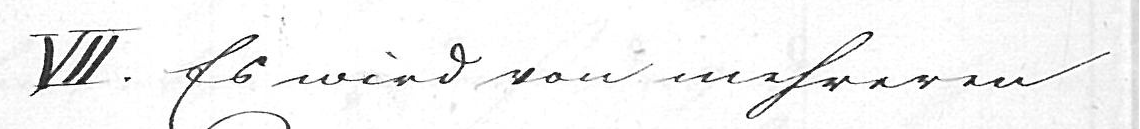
VII. Es wird von mehreren
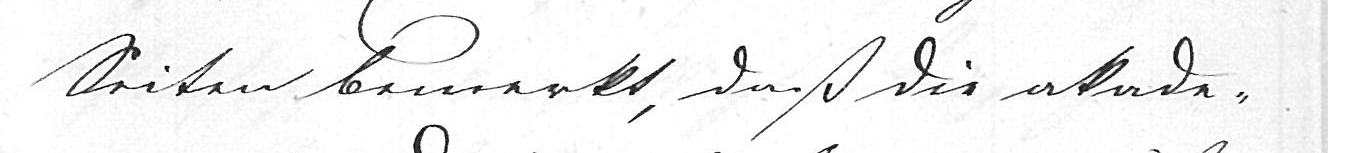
Seiten bemerkt, daß die akade-
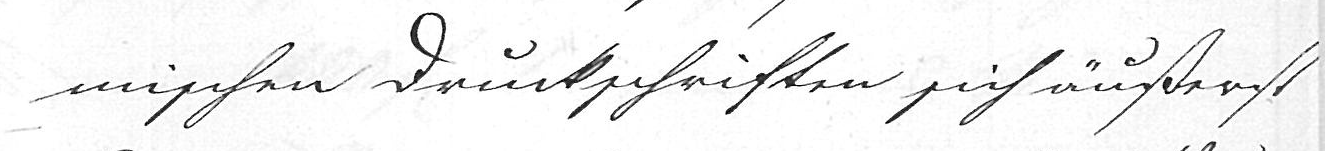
mischen Druckschriften sich äußerst
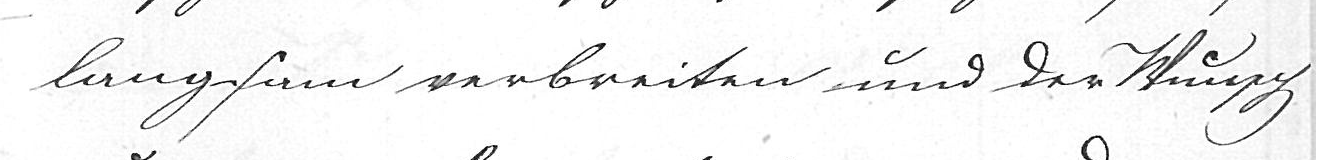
langsam verbreiten und der Wunsch
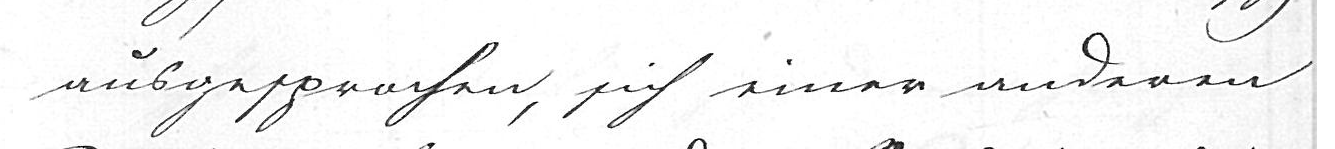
ausgesprochen, sich einer anderen
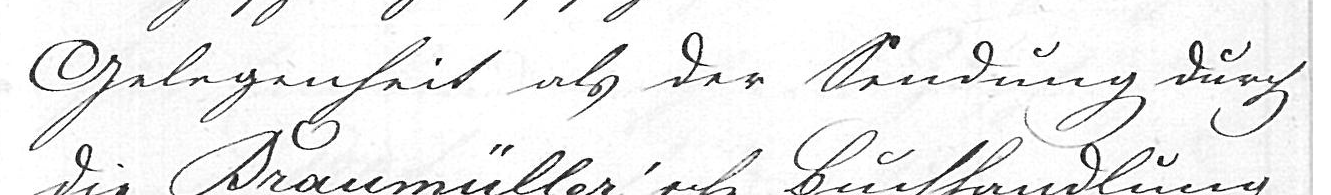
Gelegenheit als der Sendung durch
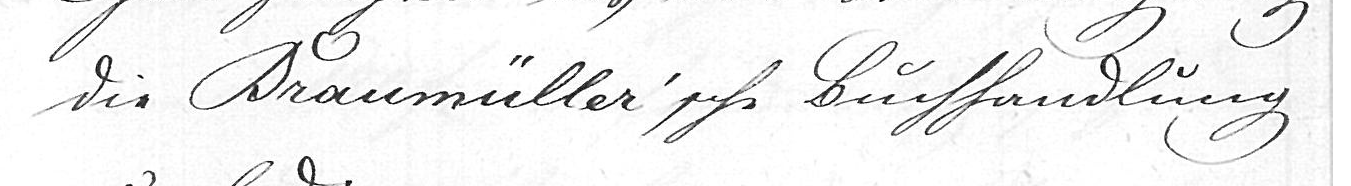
die Braumüller'sche Buchhandlung
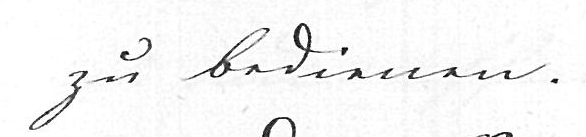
zu bedienen.
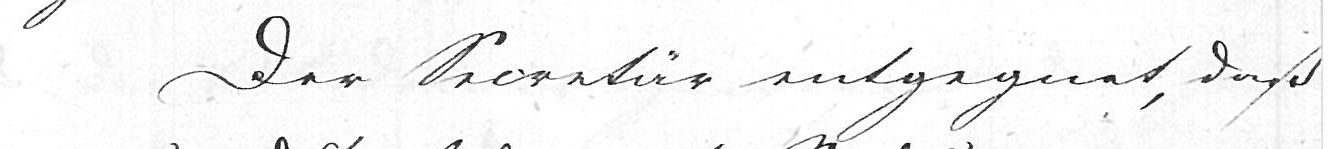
Der Secretär entgegnet daß
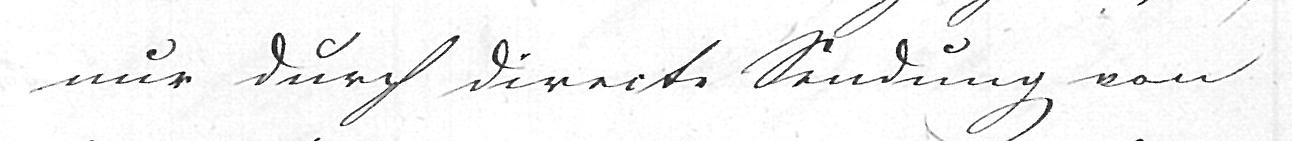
nur durch directe Sendung von
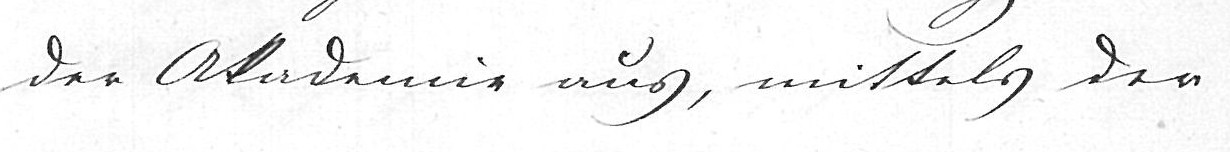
der Akademie aus, mittels der
